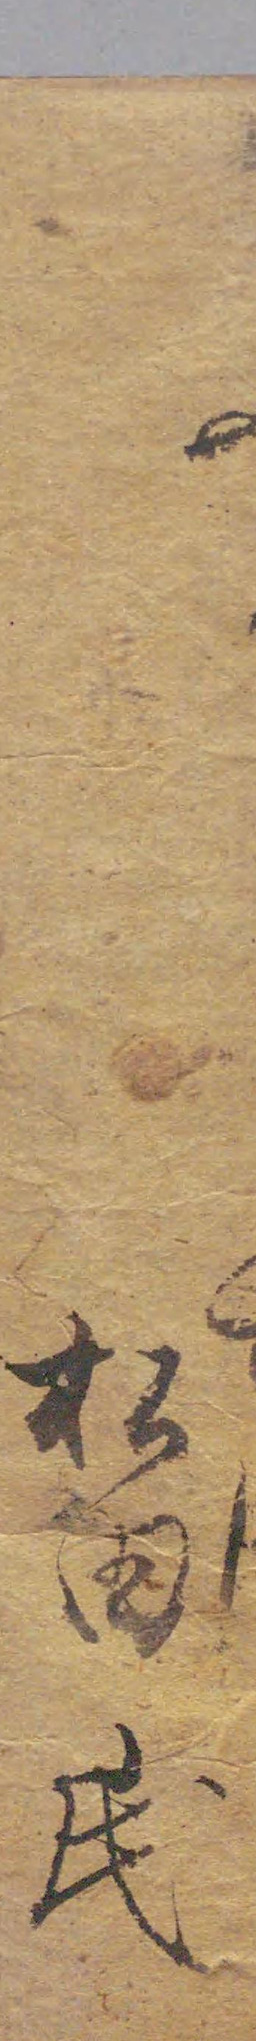松田氏
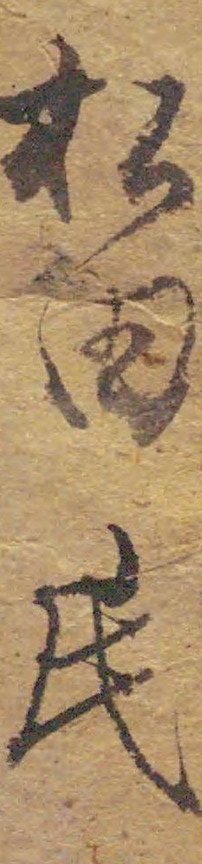松田氏

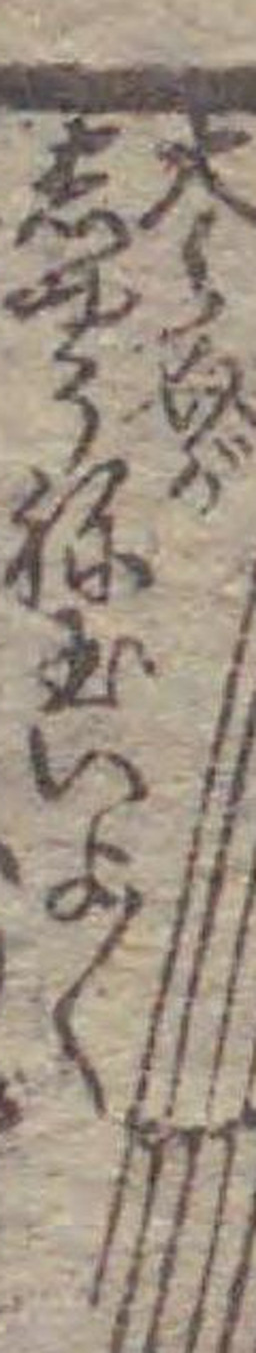しやうね玉いよ〳〵
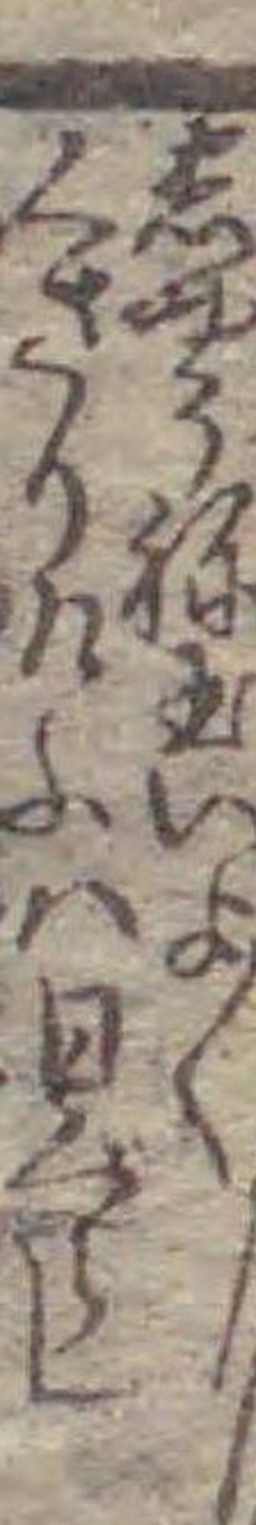くさりけふは日ぐらし
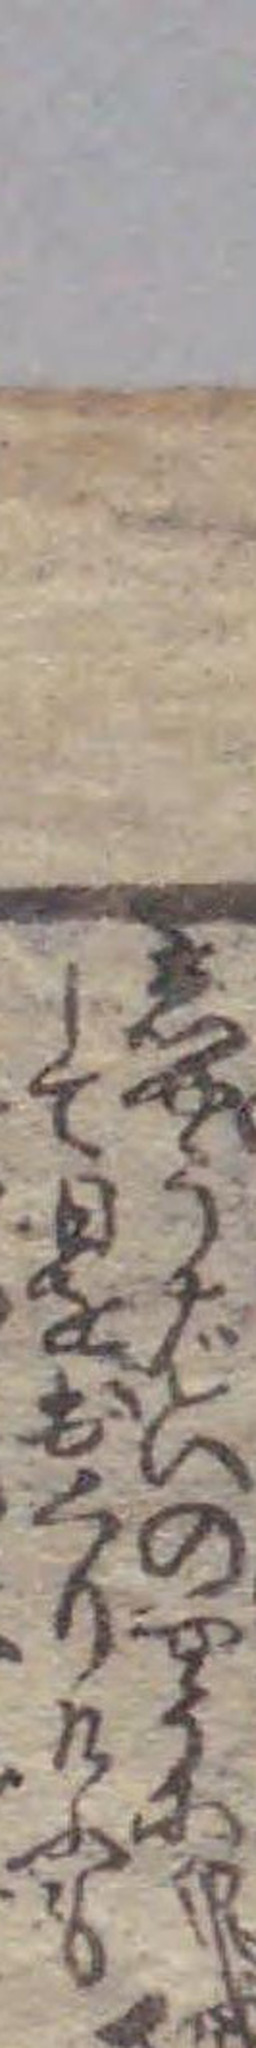して日をおくりけふも
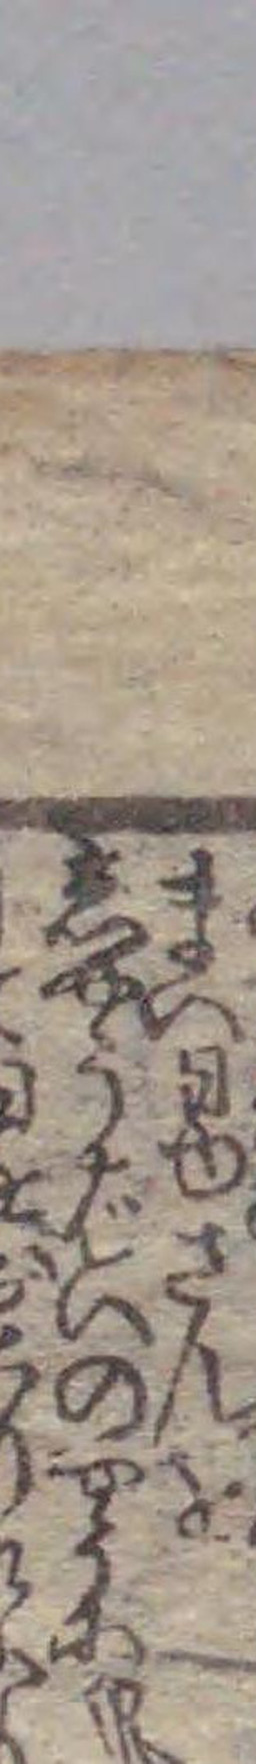しやうばいのやうに
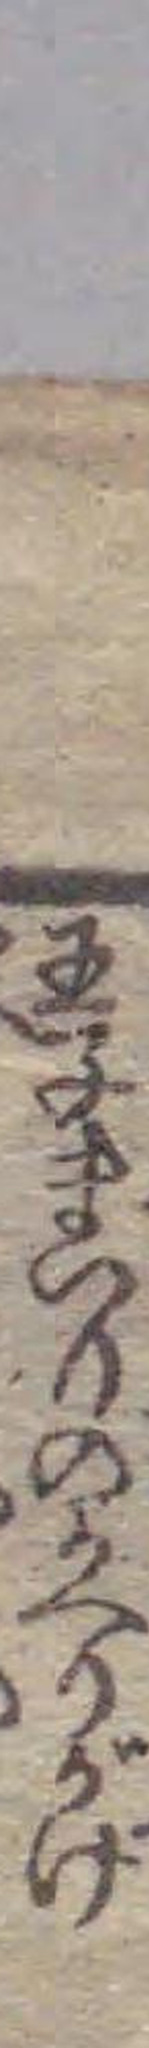王子まいりのかへりがけ
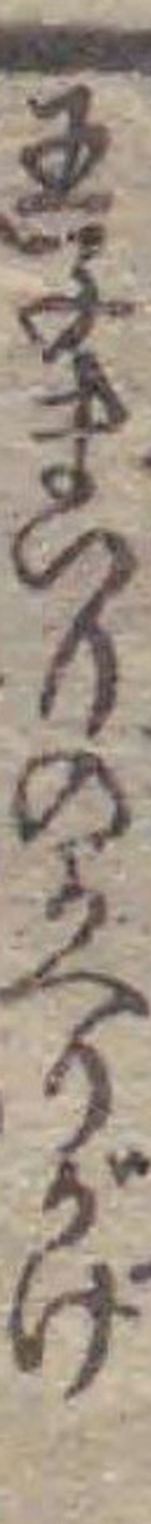王子まいりのかへりがけ
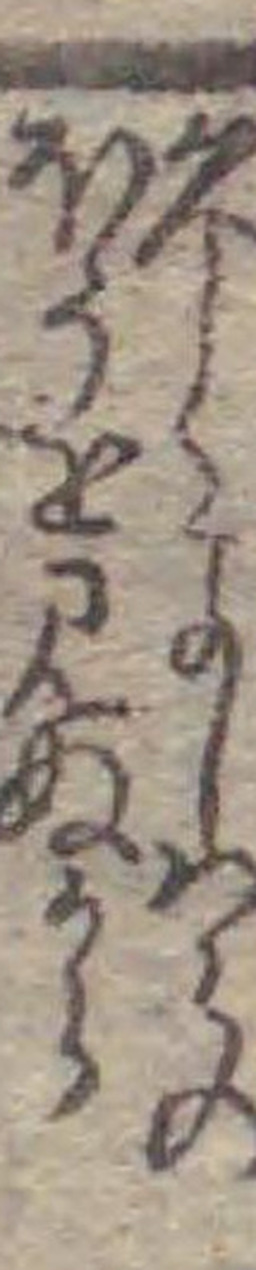ほうを見ぬから
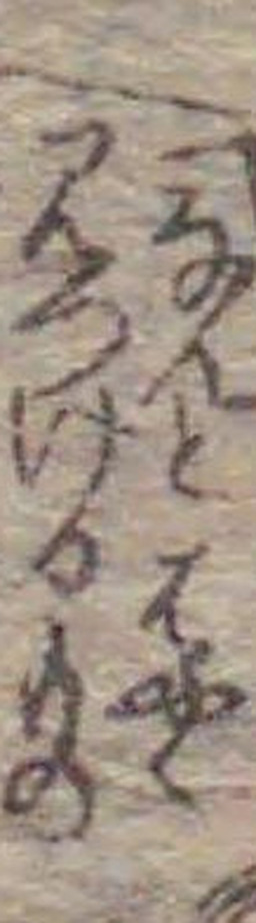見つけるもの
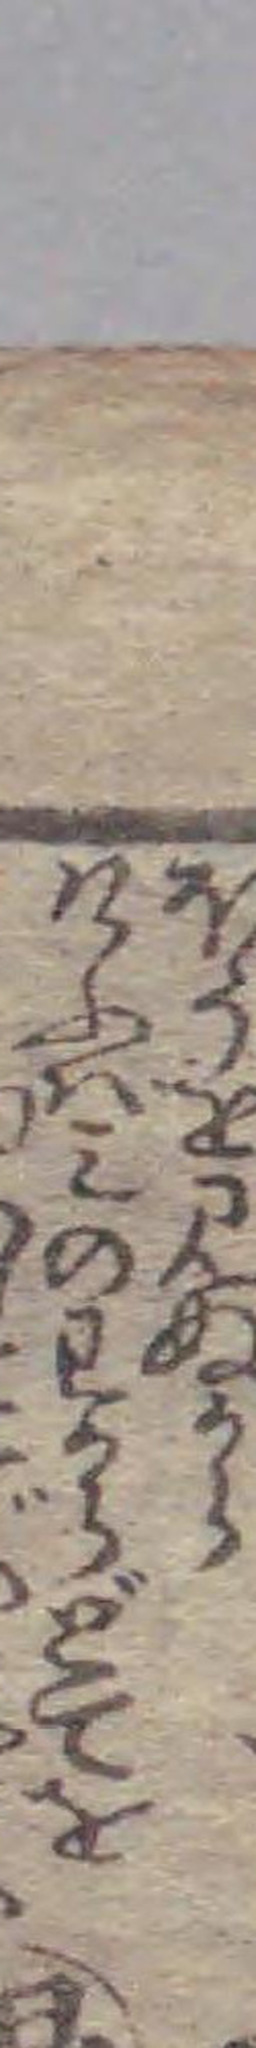けふはみのわからどてを
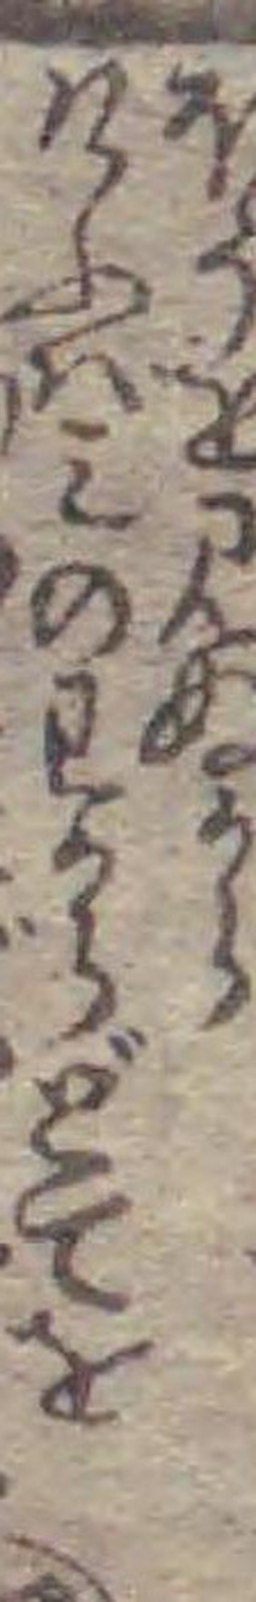けふはみのわからどてを
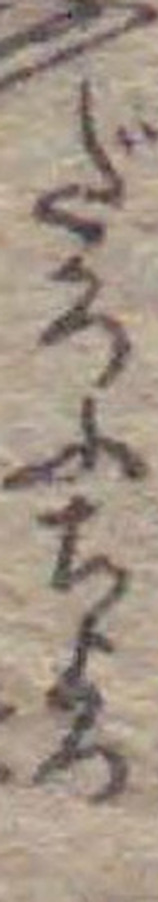だろふちよつ
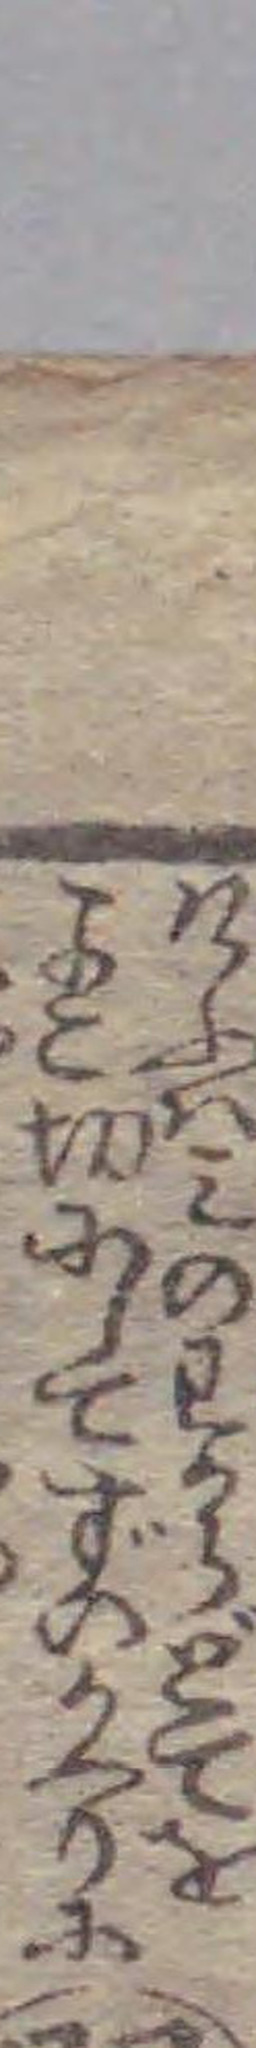よこ切にしてずいかへりに
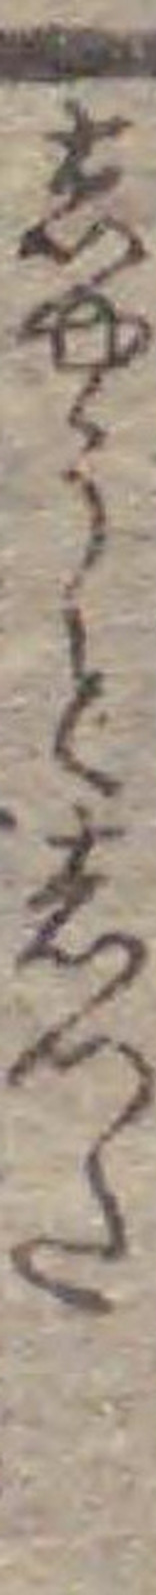しやうとしつた
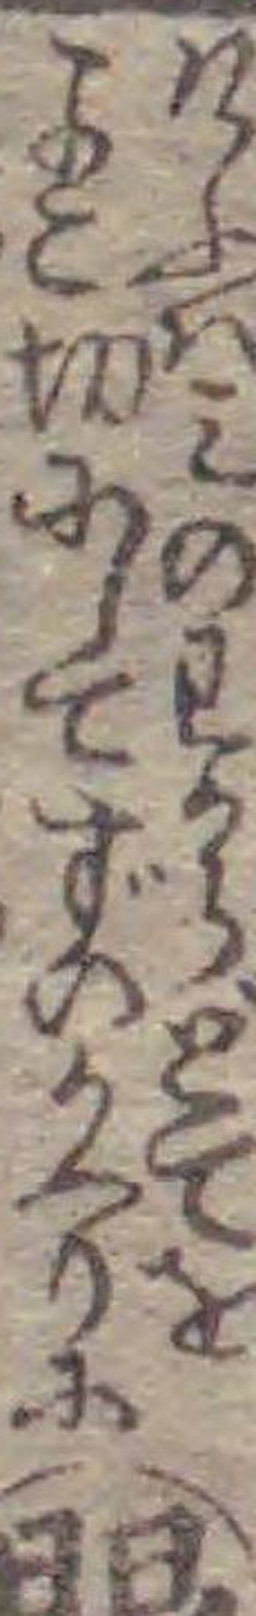よこ切にしてずいかへりに
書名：四遍搨心学草帋 : 3巻
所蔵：国立国会図書館 National Diet Library, JAPAN
